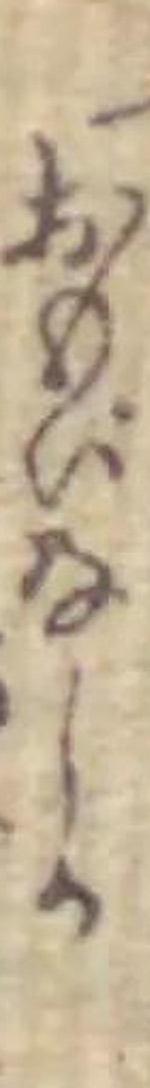〽おもいなしか
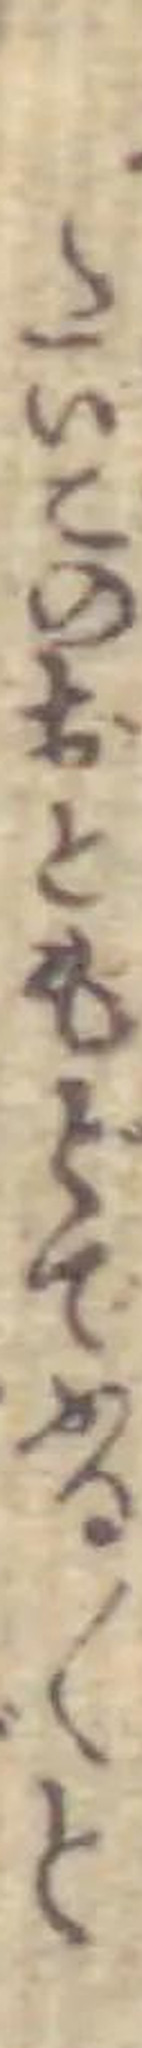たいこのおともどでふる〳〵と
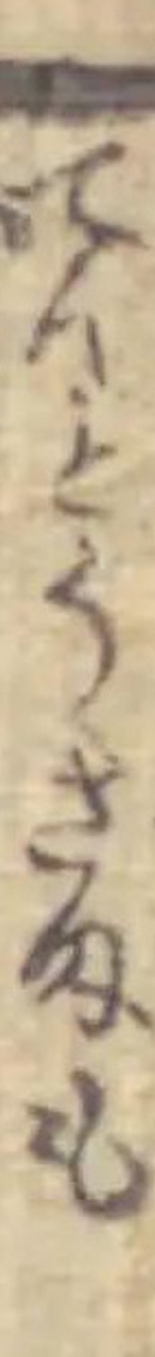てんとうさまも
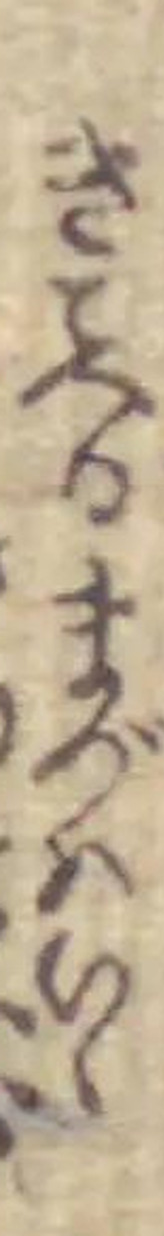きこへるまづはいゝ
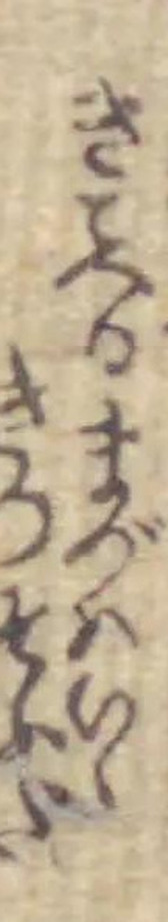きこへるまづはいゝ
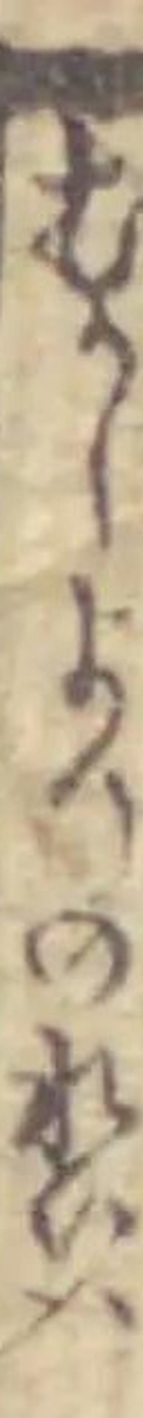むかしよりのれいは
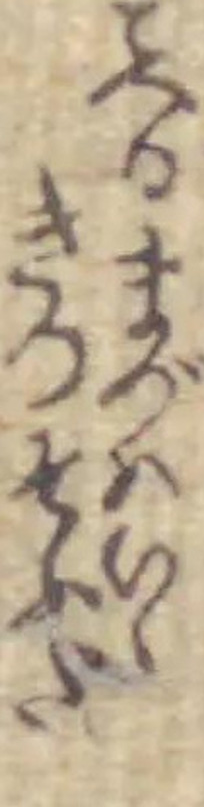きつそふだ
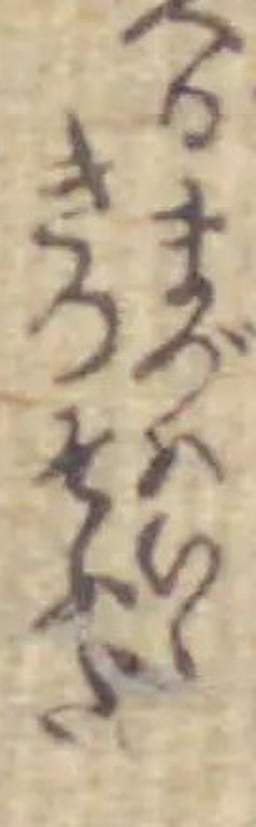きつそふだ
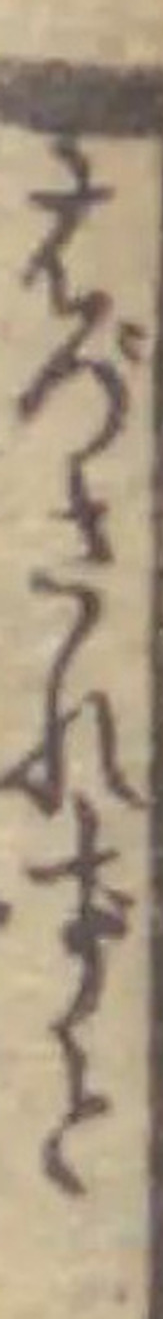はづされずと
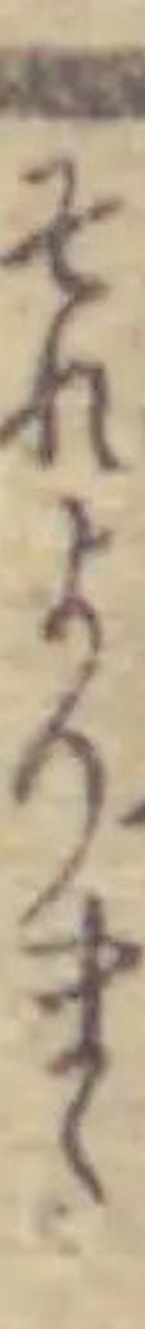それよりまゝ
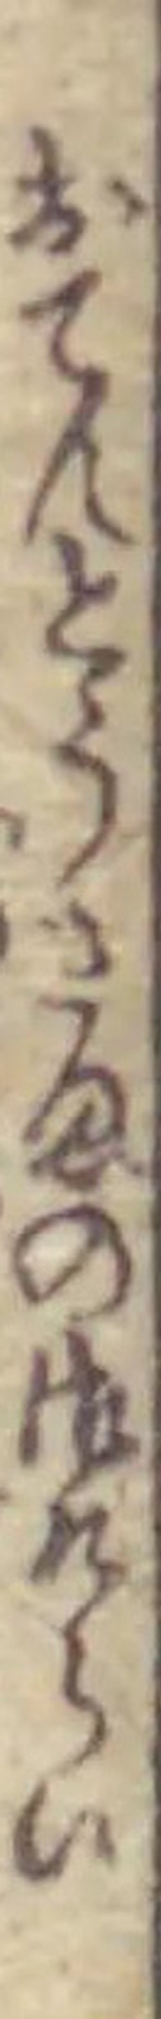おてんとうさまの御けらひ
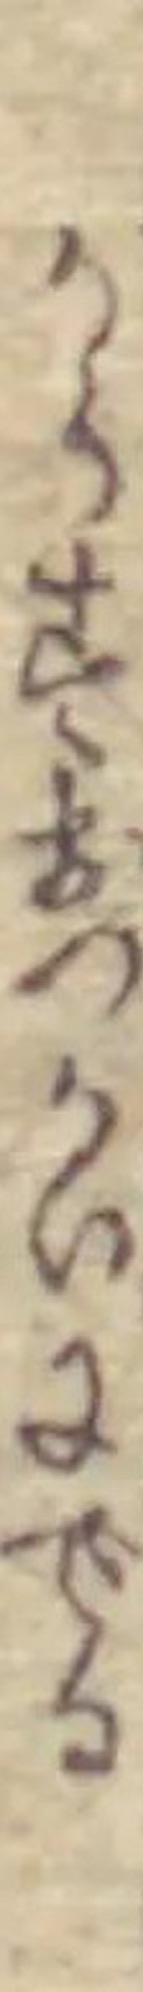からすおつかいにでる
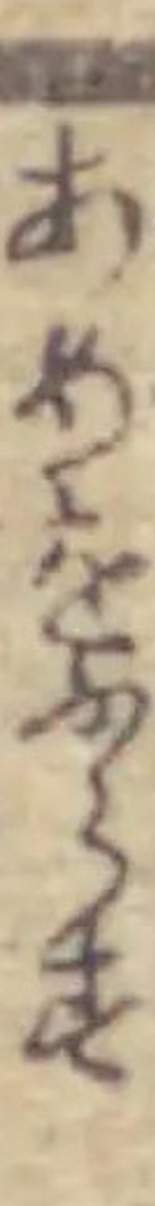あめをふらす
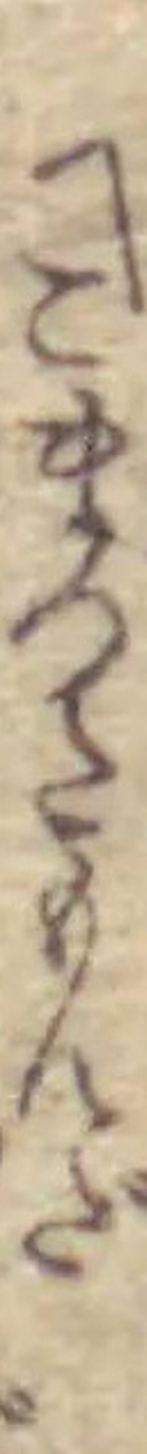〽こまつたもんだ
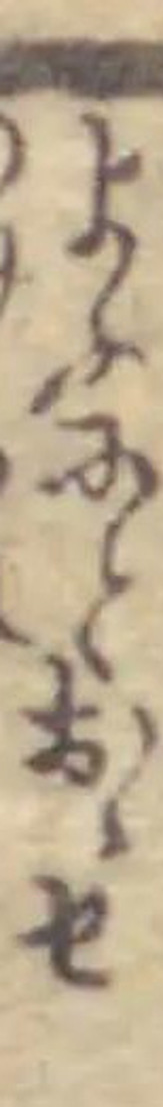よふにとおゝせ
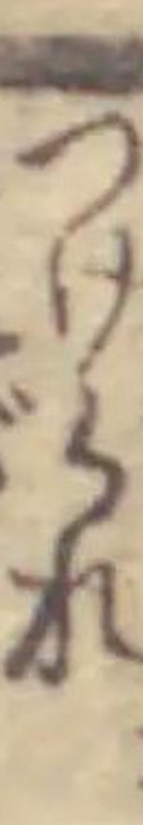つけられ
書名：雨宮風宮出儘略縁記 3巻
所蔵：国立国会図書館 National Diet Library, JAPAN
